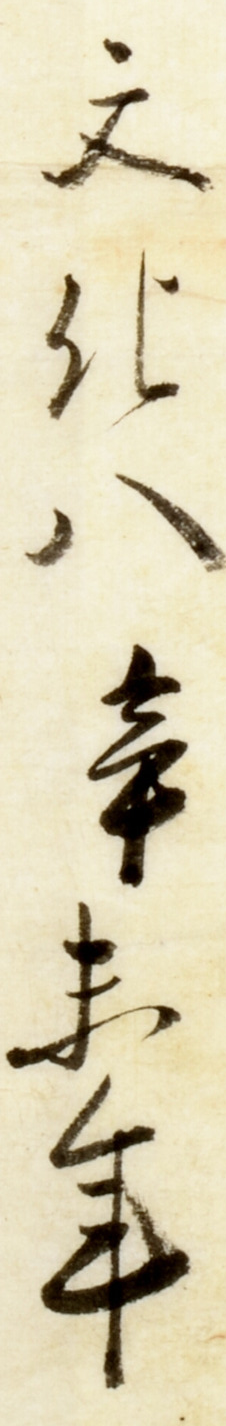文化八年辛未年
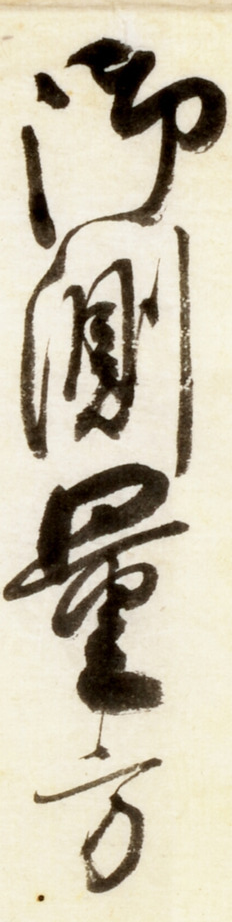御測量方
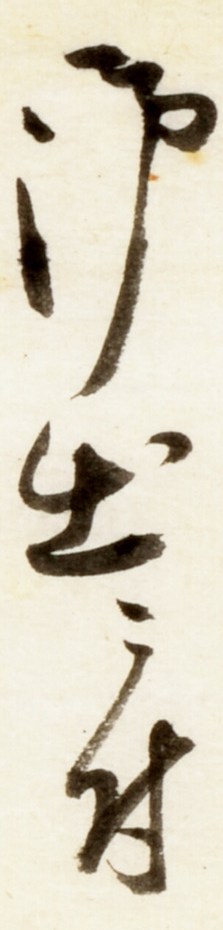御出ニ付
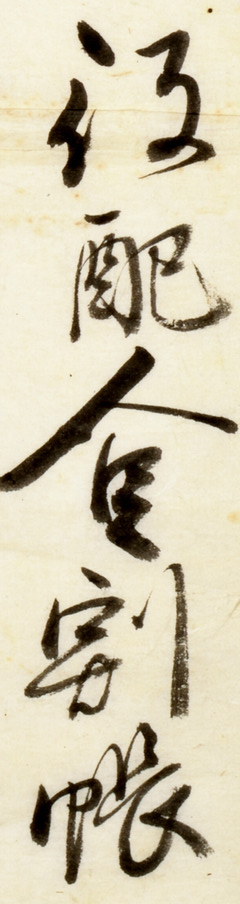役配人足割帳

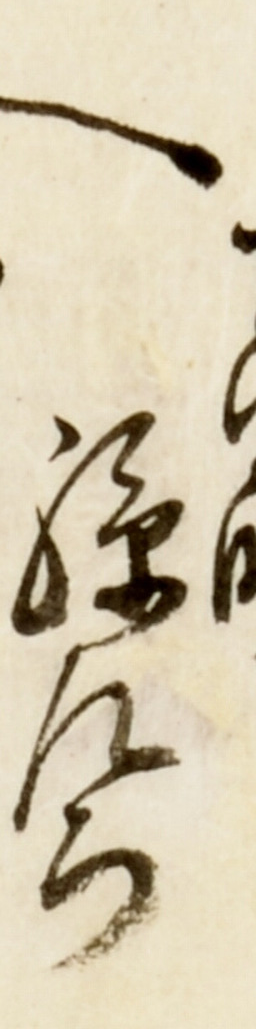孫左衛門
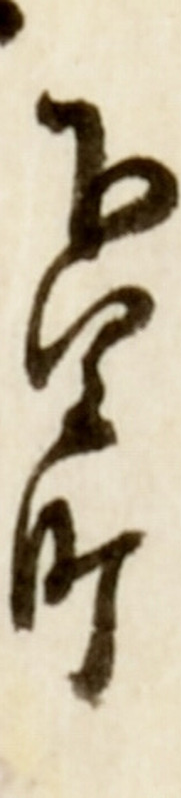下里町
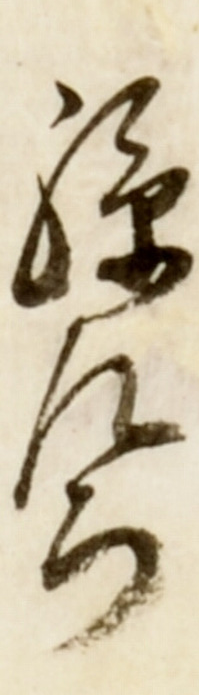孫左衛門
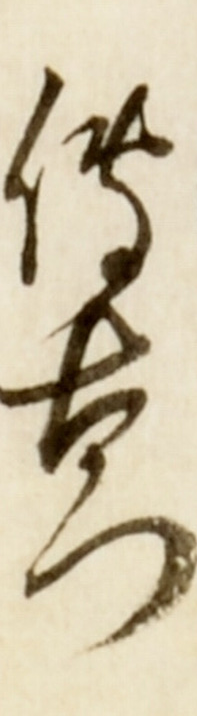傳右衛門
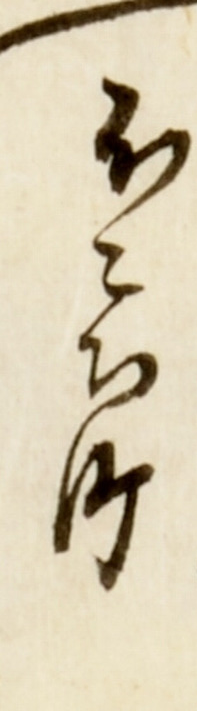ほこち町
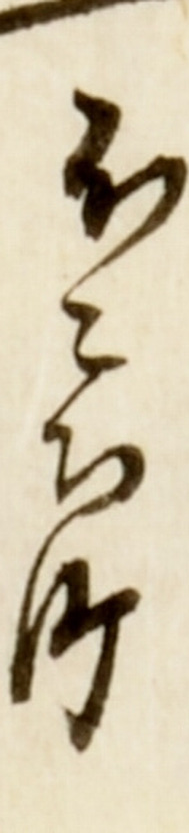ほこち町
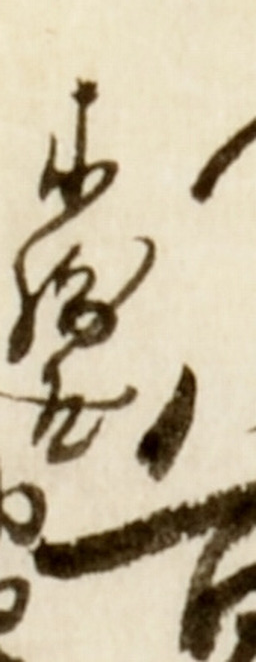木綿屋
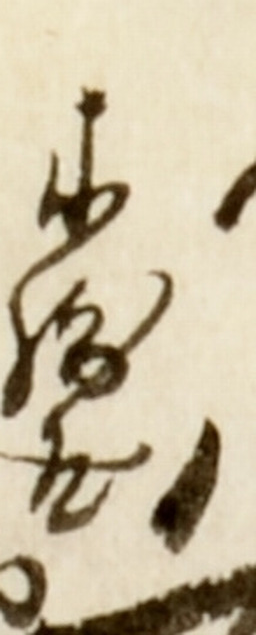木綿屋
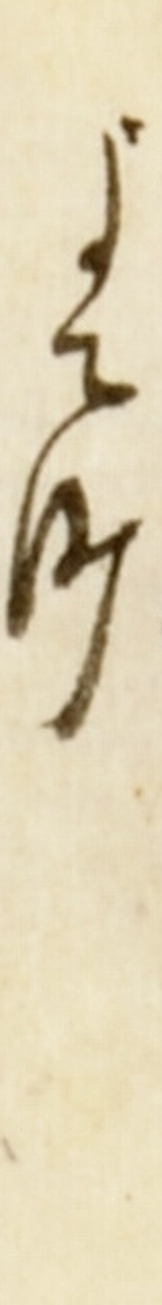よこ町
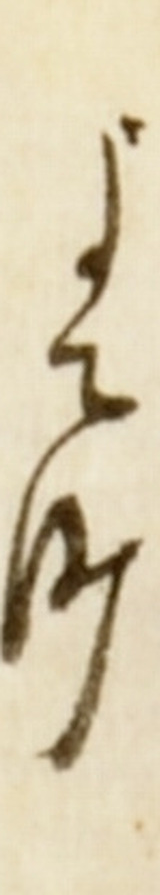よこ町
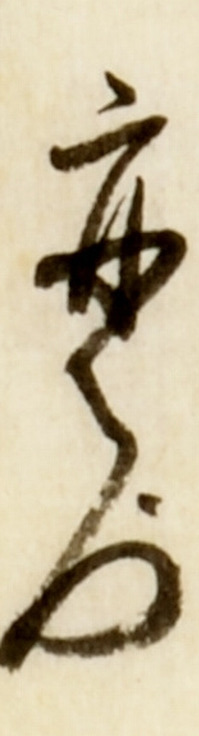傳右衛門
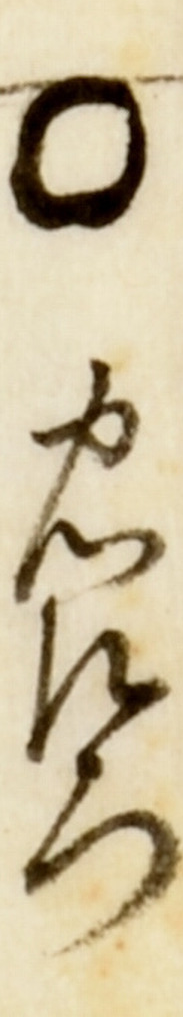孫左衛門
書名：役配人足割合帳
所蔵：伊那市立高遠町図書館・合同会社AMANE
